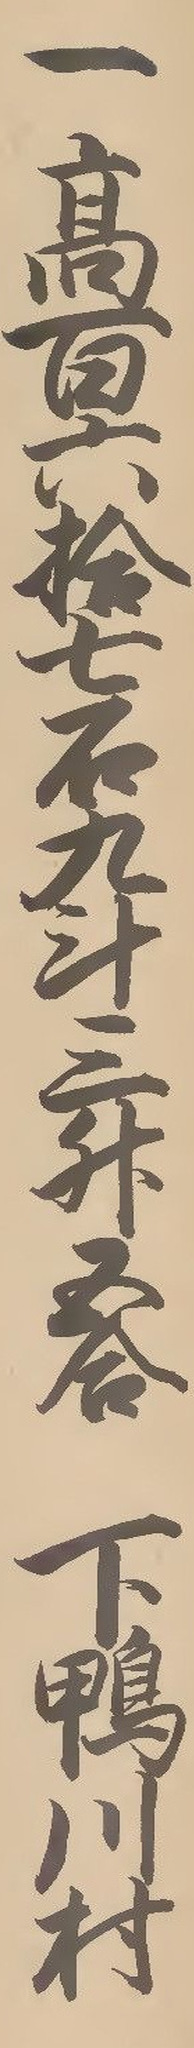一髙百六拾七石九斗三升五合下鴨川村
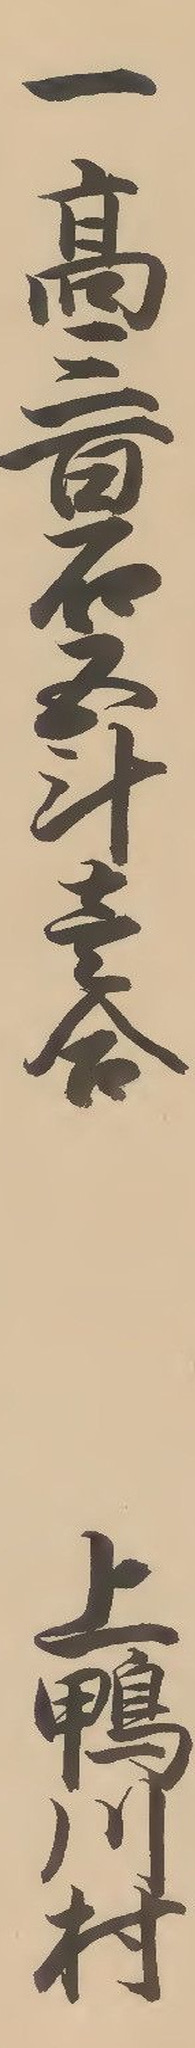一髙三百石五斗壱合上鴨川村

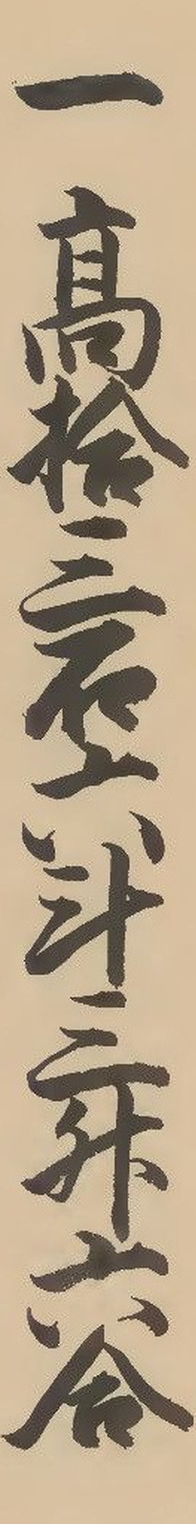一髙拾三石六斗三升六合
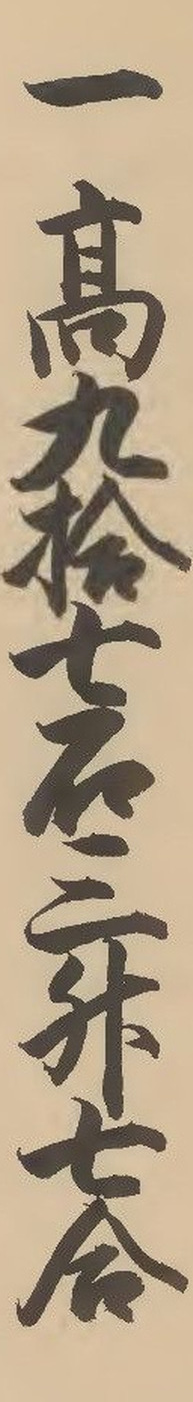一髙九拾七石三升七合
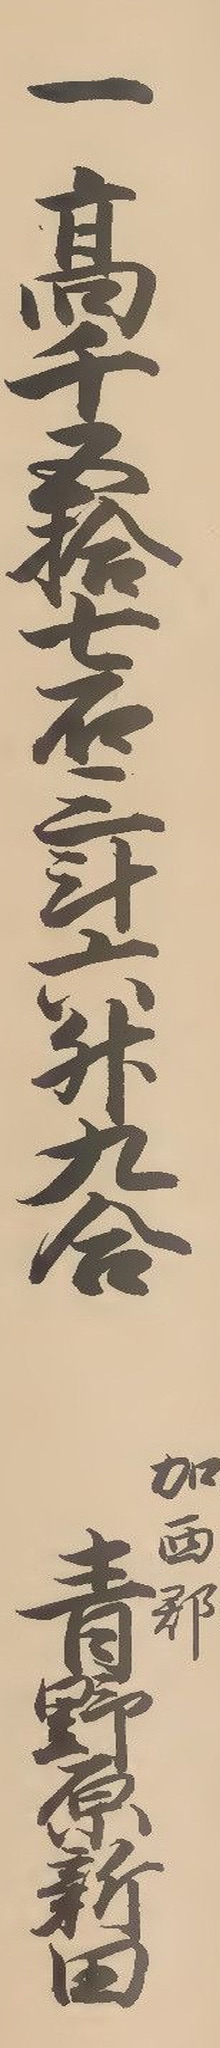一髙千五拾七石三斗六升九合青野原新田
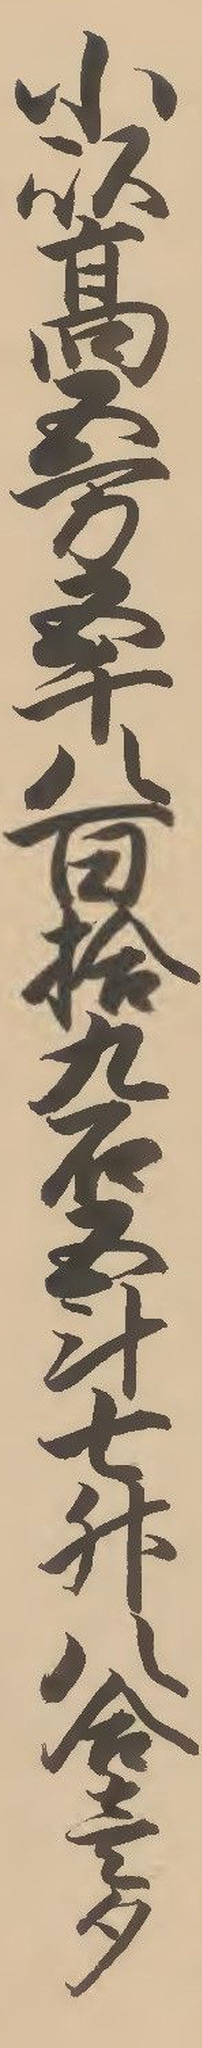小以髙五万五千八百拾九石五斗七升八合壱夕

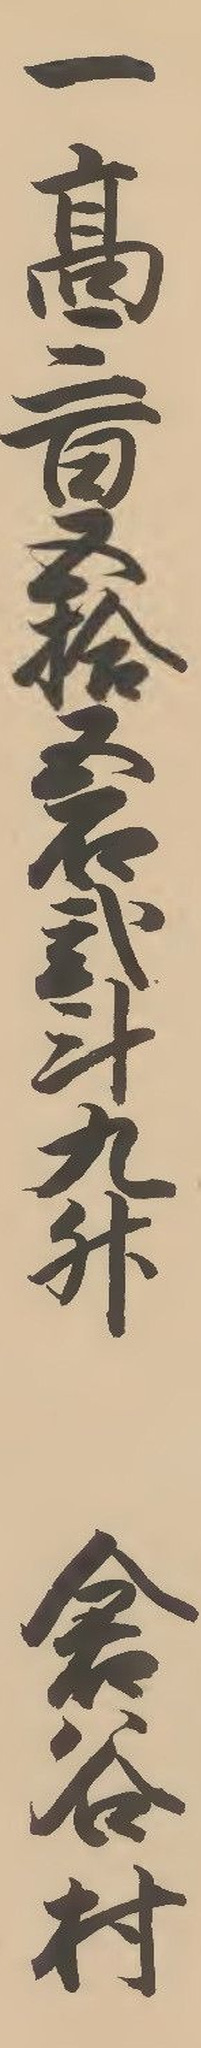一髙三百五拾五石弐斗九升倉谷村
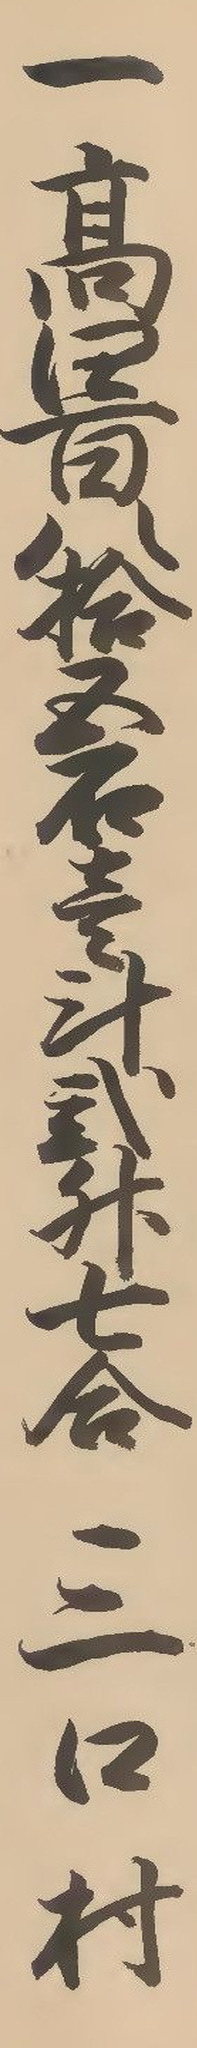一髙四百八拾五石壱斗弐升七合三口村
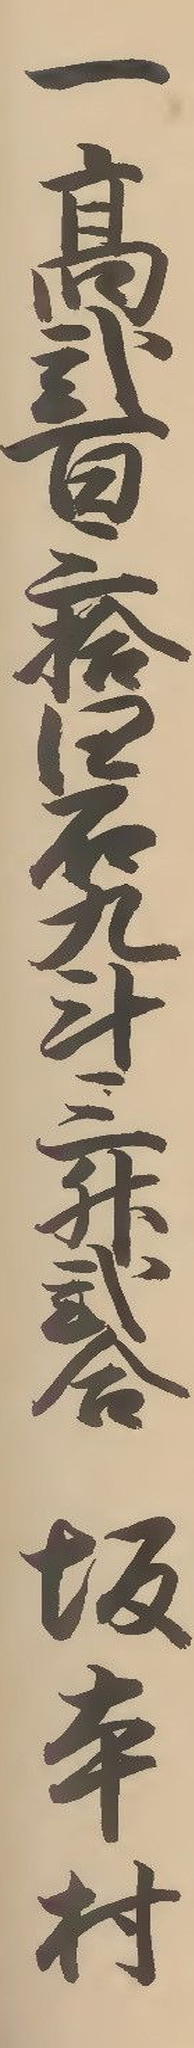一髙弐百三拾四石九斗三升弐合坂本村
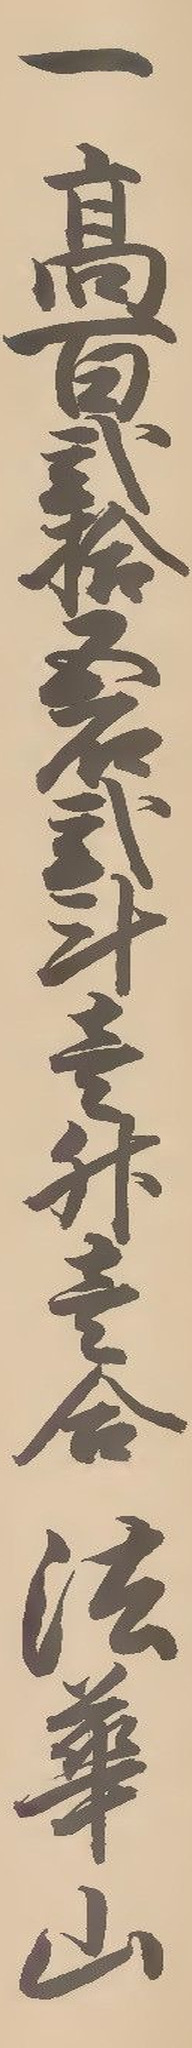一髙百弐拾五石弐斗壱升壱合法華山
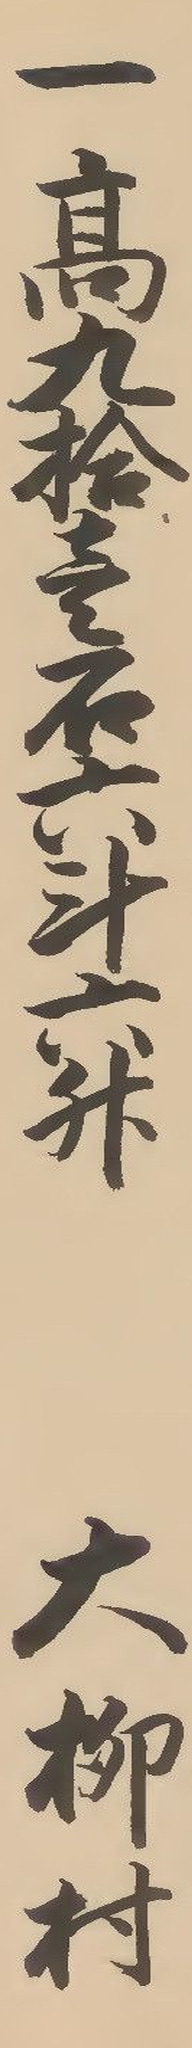一髙九拾壱石六斗六升大柳村
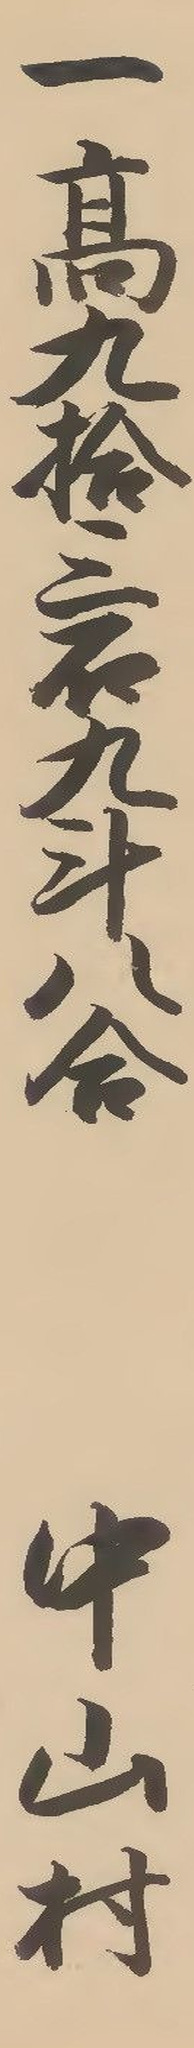一髙九拾三石九斗八合中山村
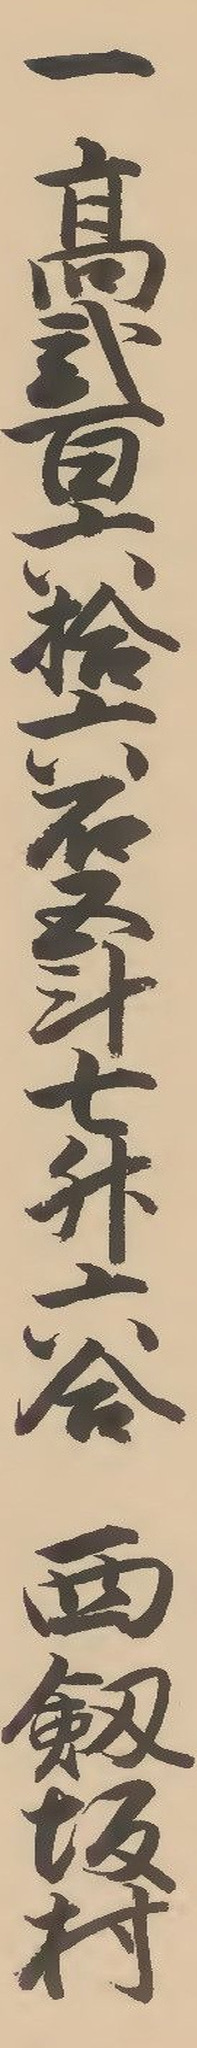一髙弐百六拾六石五斗七升六合西剱坂村

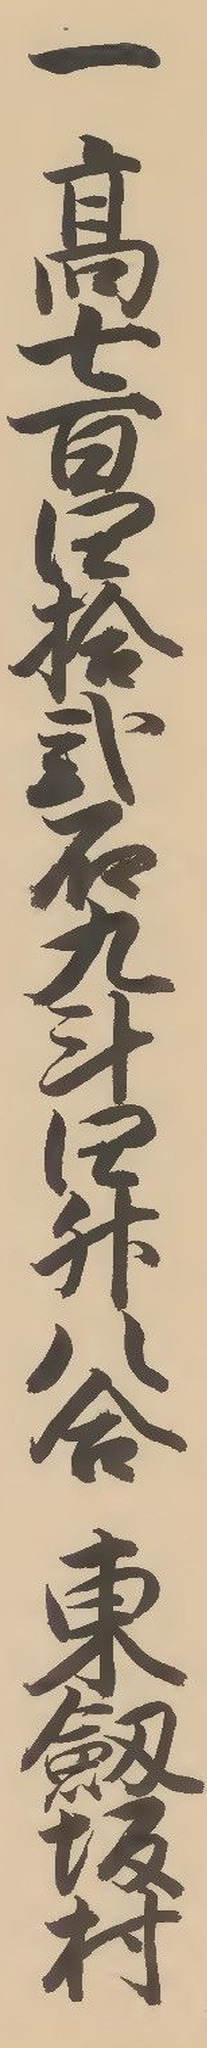一髙七百四拾弐石九斗四升八合東剱坂村
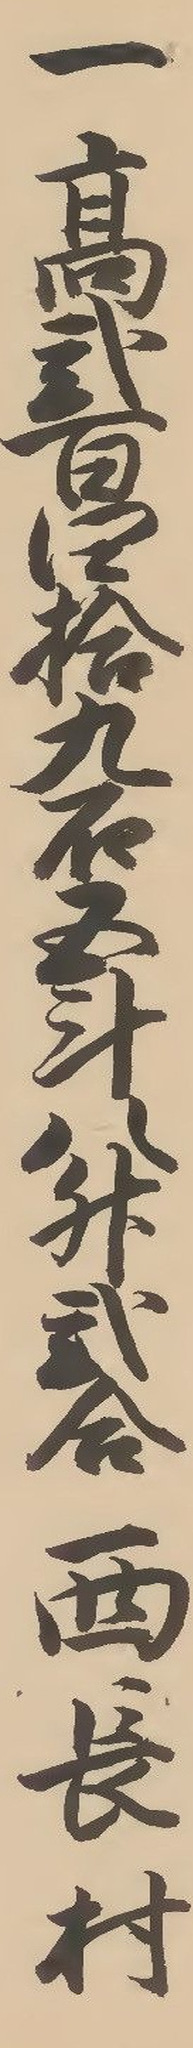一髙弐百四拾九石五斗八升弐合西長村
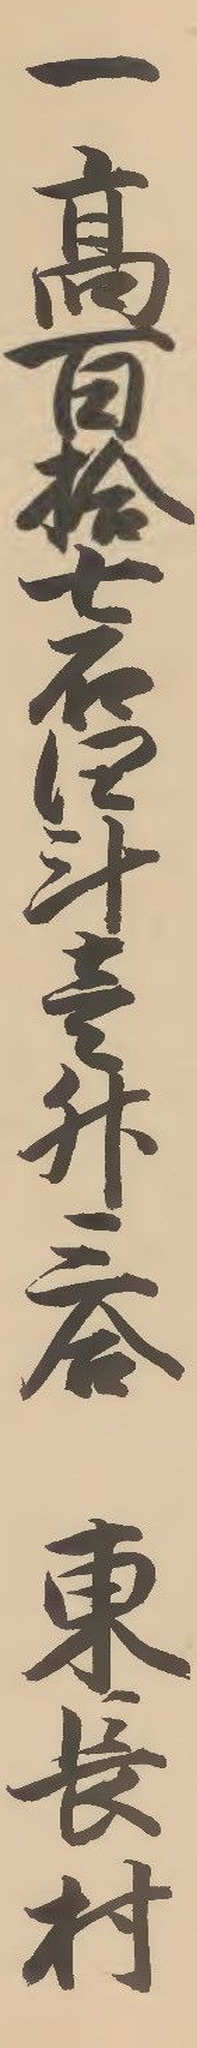一髙百拾七石四斗壱升三合東長村
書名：播磨国郷帳
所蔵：国立公文書館 National Archives of Japan
